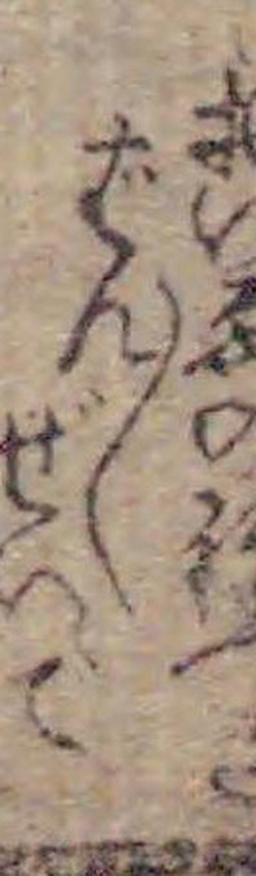ばん〳〵
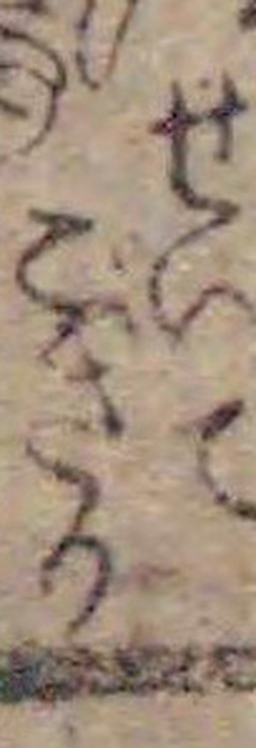ござり
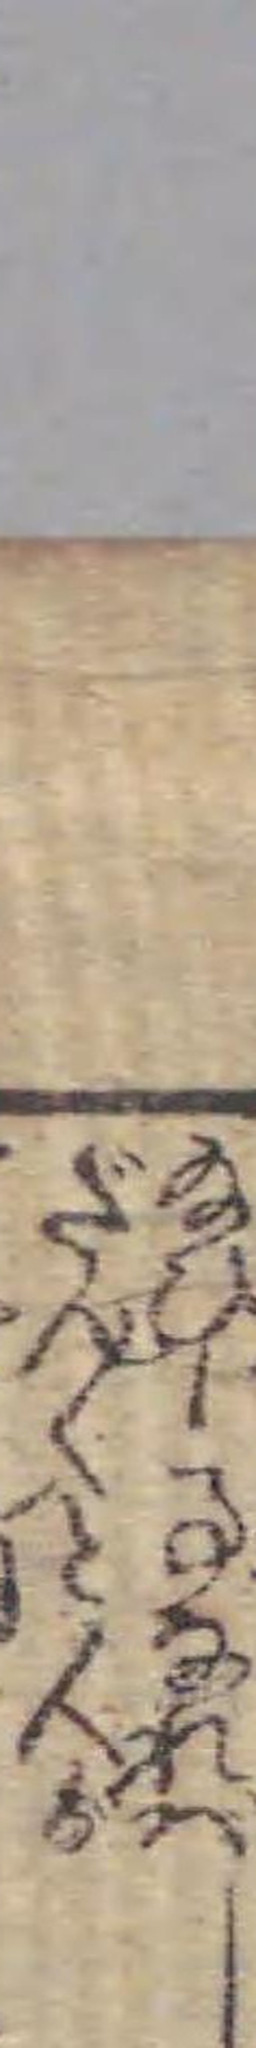だん〳〵と人が
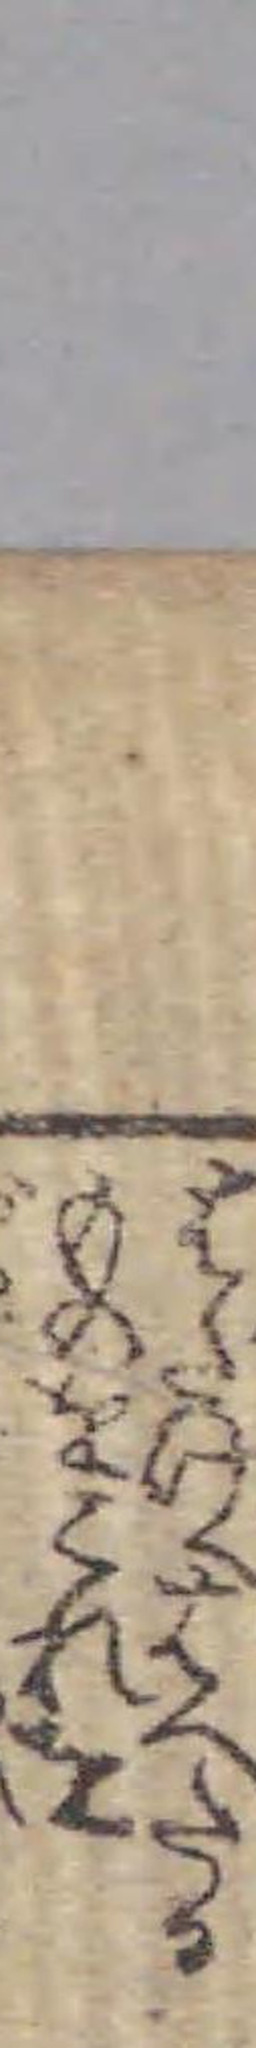ものをこれを
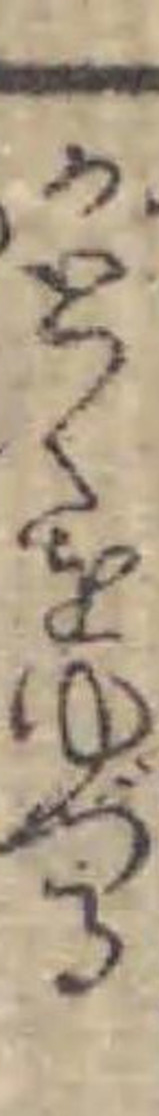かとくをゆづる
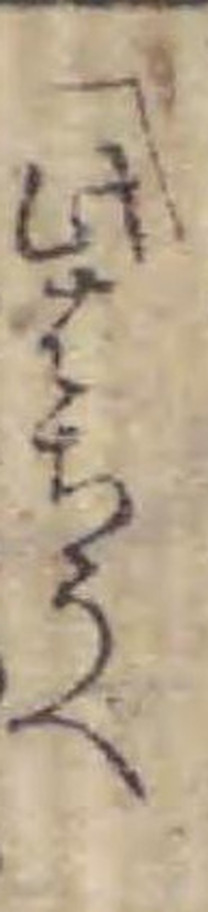〽此はちうへ
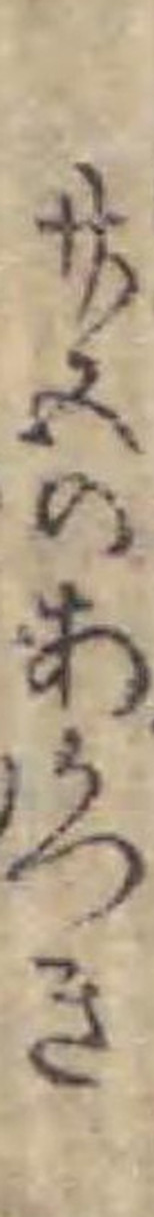廿五のあかつき
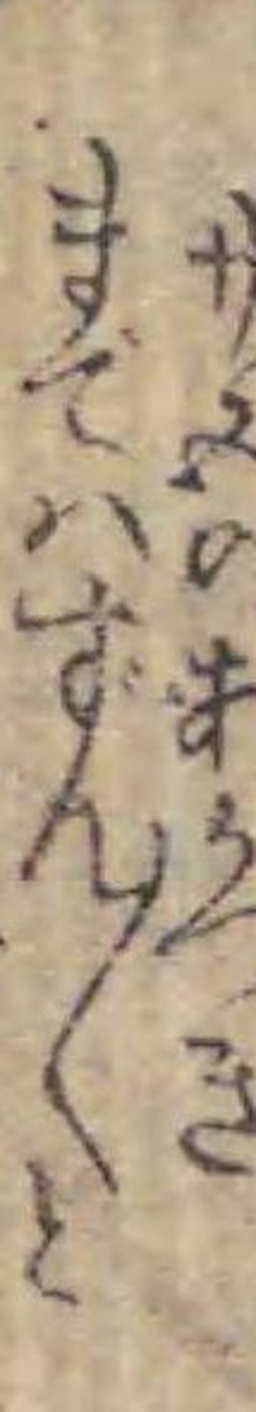まではずん〳〵と
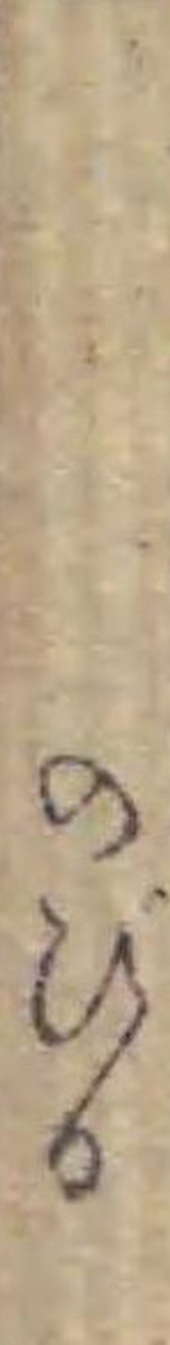のびる
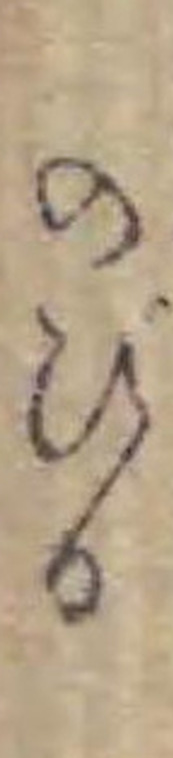のびる
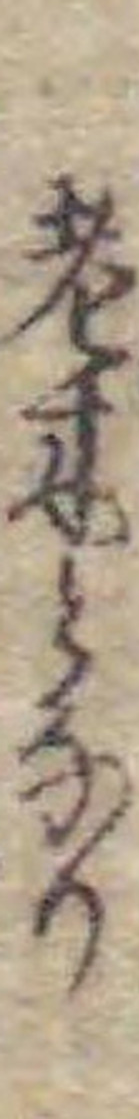老木となり
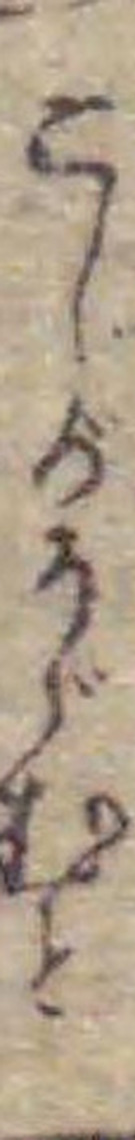こしがかゞむと
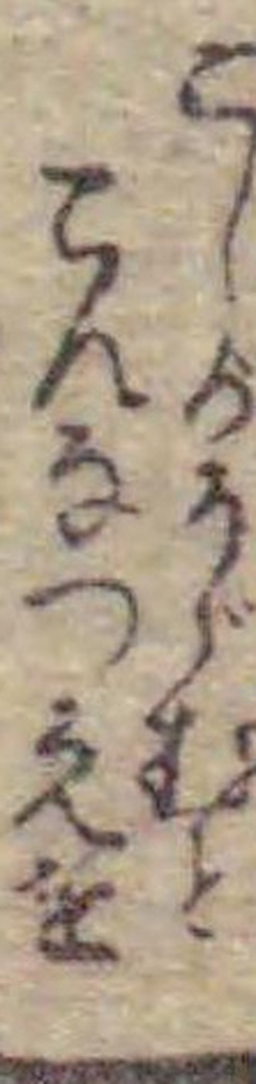こんなつえを
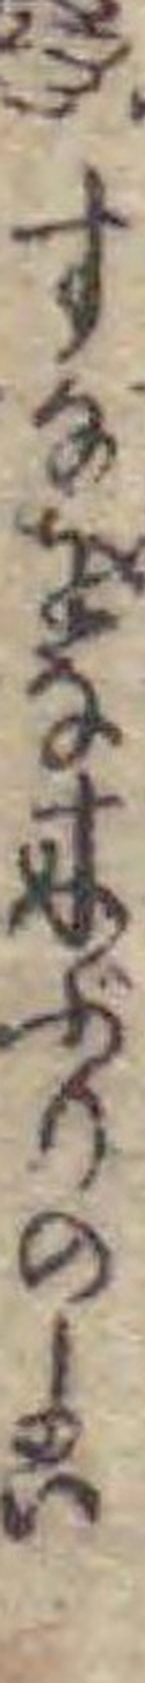すなをな木ぶりのよい
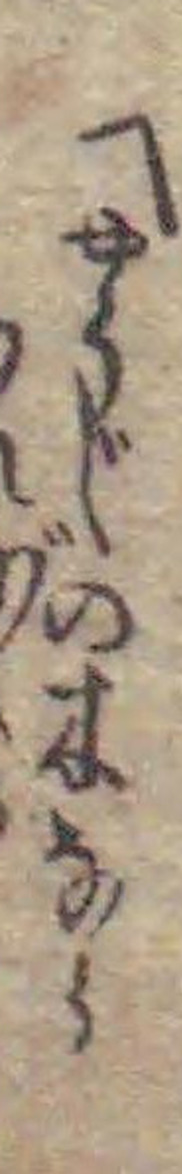〽やうじの木なら
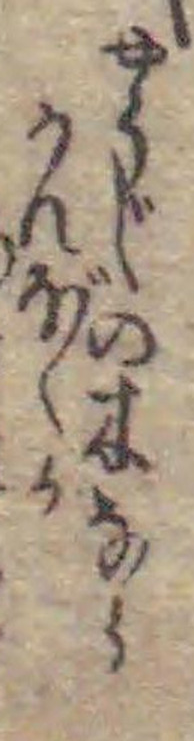かんぼくか
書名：奇妙頂礼胎錫杖 : 3巻
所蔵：国立国会図書館 National Diet Library, JAPAN
